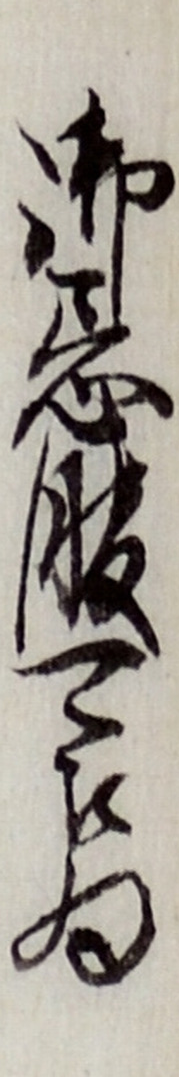御忌服可被為
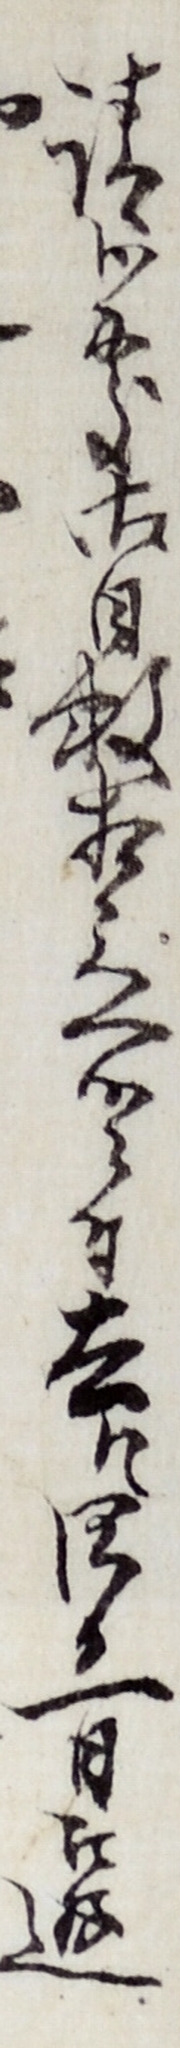請候処御日数相立候ニ付去ル四日一日被遊
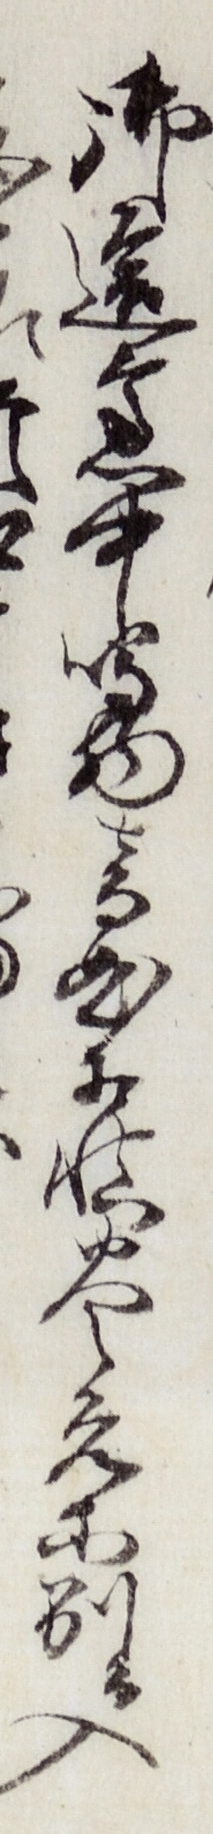御遠慮中鳴物音曲相慎火之元等別而入
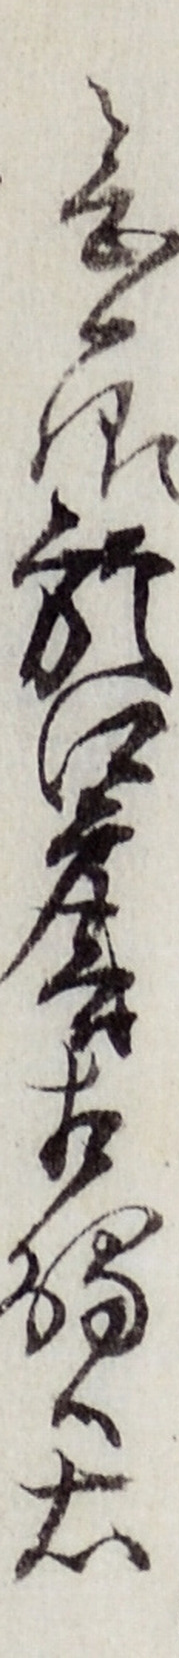念候様於江戸表相触候右
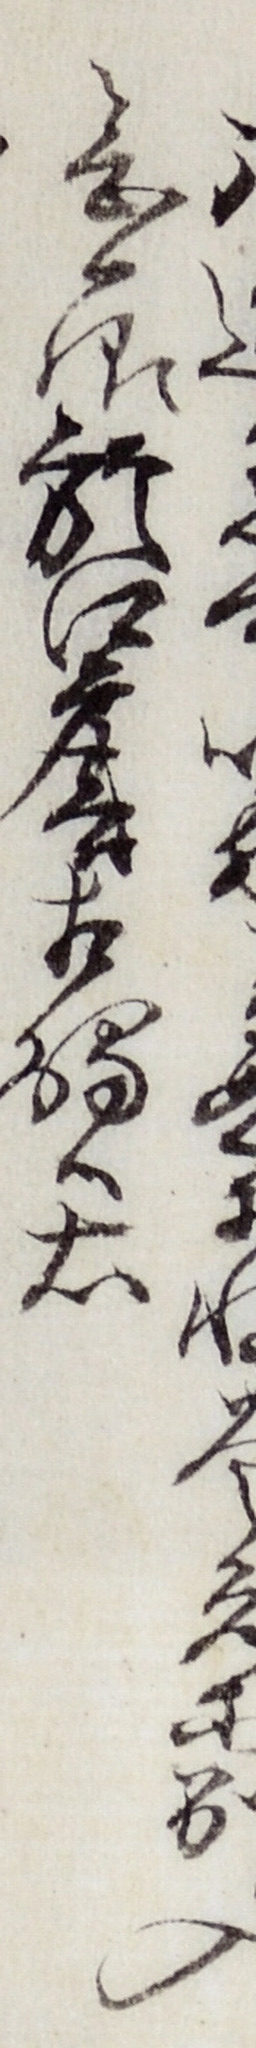念候様於江戸表相触候右
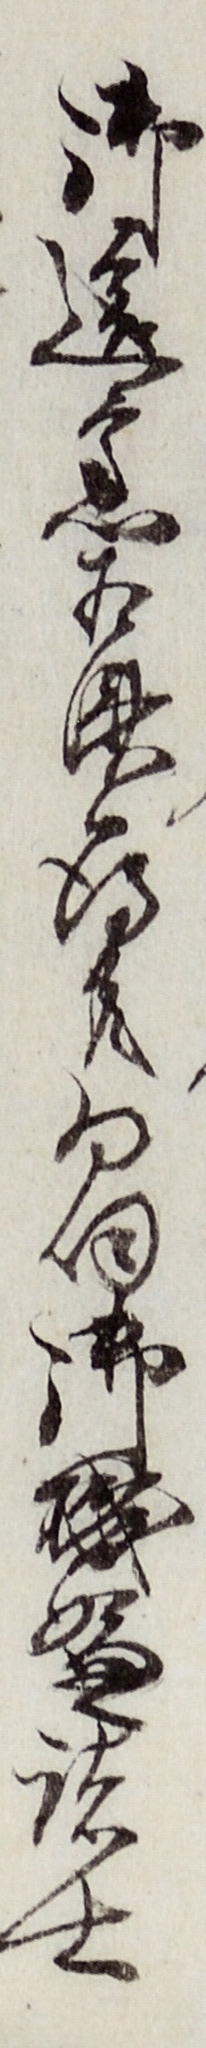御遠慮相済候得共為伺御機嫌諸士
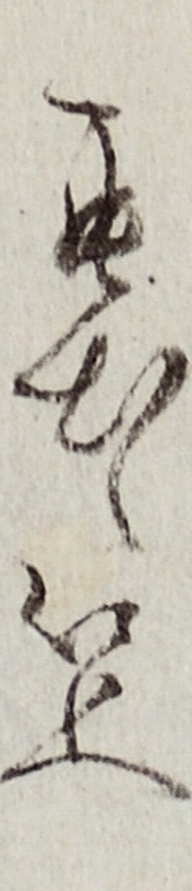罷出候以上
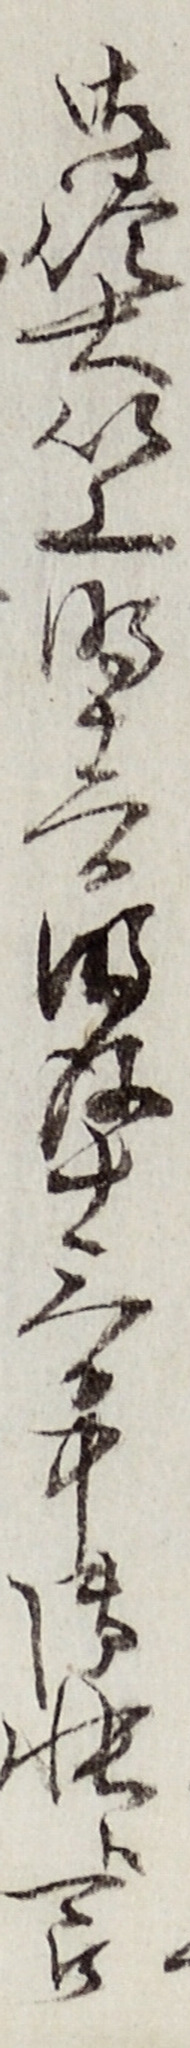御徒士以上明十二日明後十三日中御帳江可被
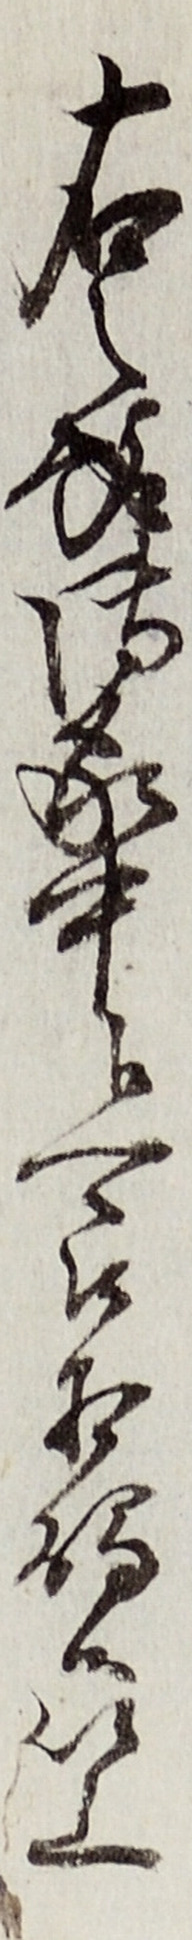右之趣御家中江可被相触候以上
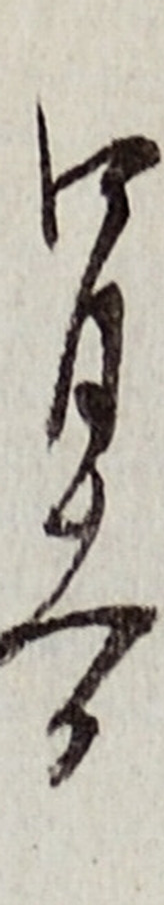四月十一日
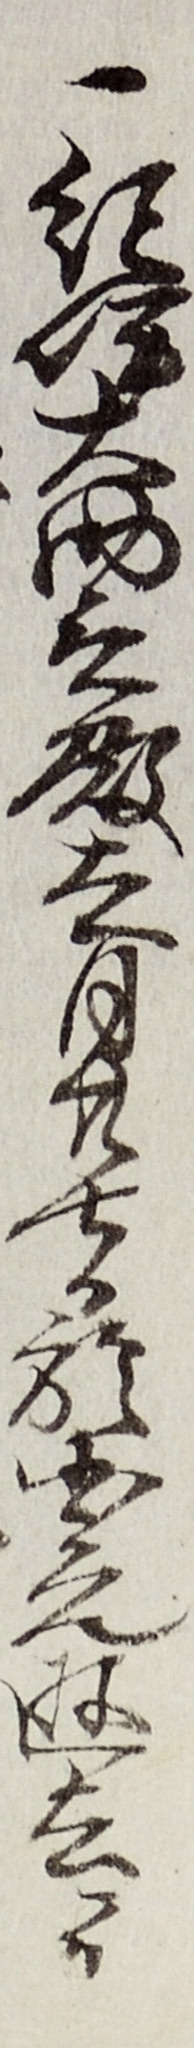一紀伊大納言殿去月廿七日於国元逝去ニ付
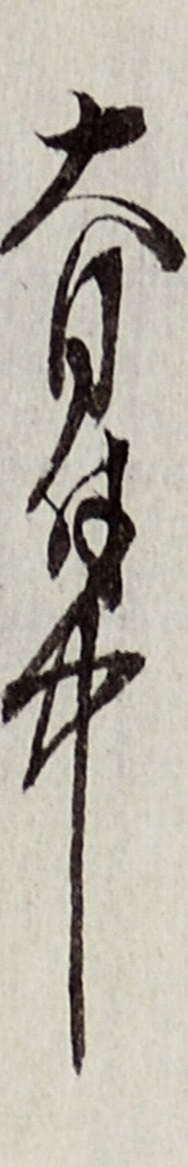大目付中
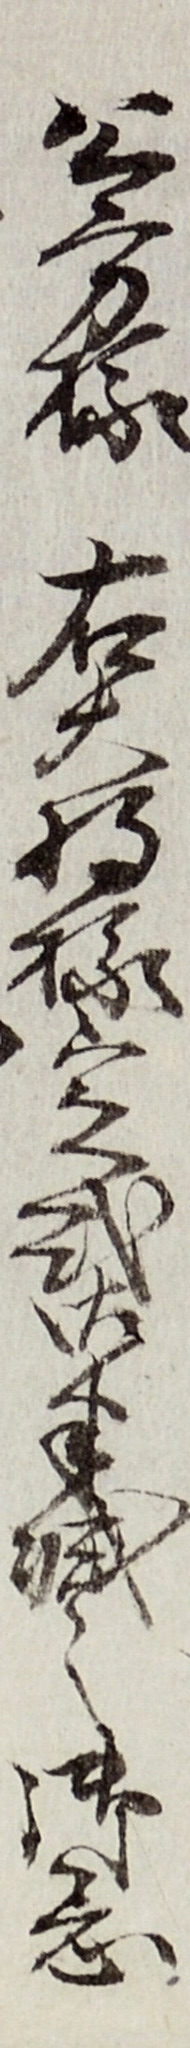公方様右大将様定式御半減之御忌
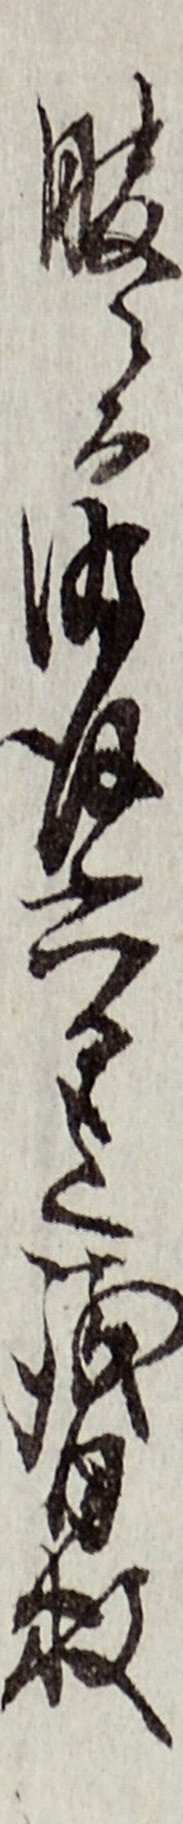服ニ而明後六日迄残日数
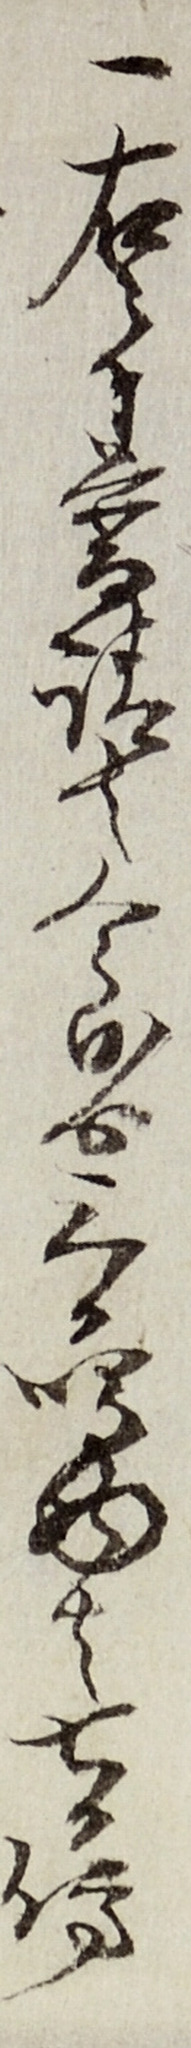一右ニ付普請者今日ゟ三日鳴物者七日停
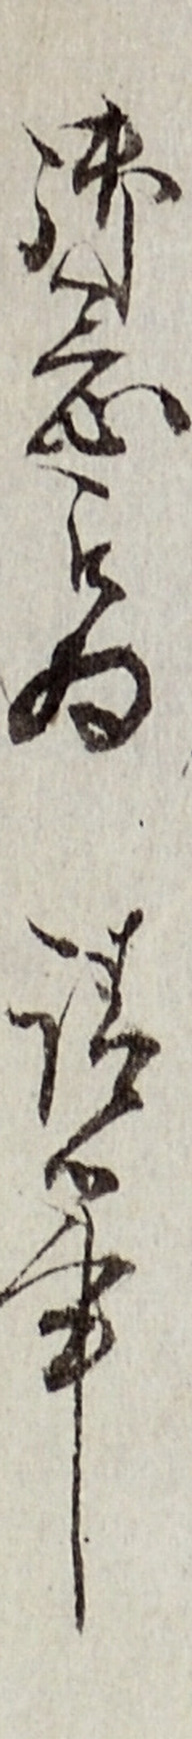御忌被為請候事
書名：御山方御薪方諸事御用留
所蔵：伊那市立高遠町図書館・合同会社AMANE
